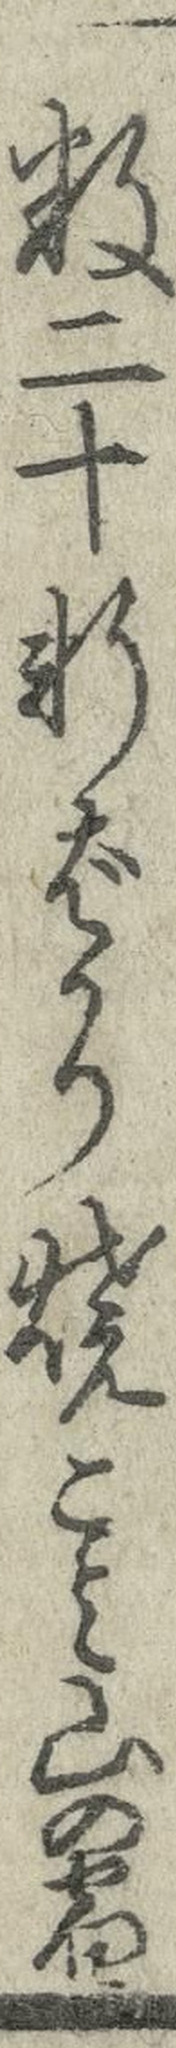数二十軒ばかり焼こと山の宿
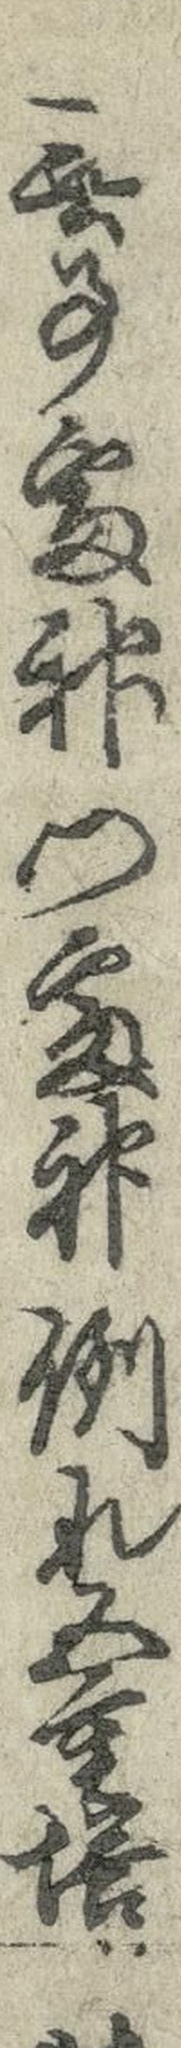無事雷神門雷神倒れ五重塔
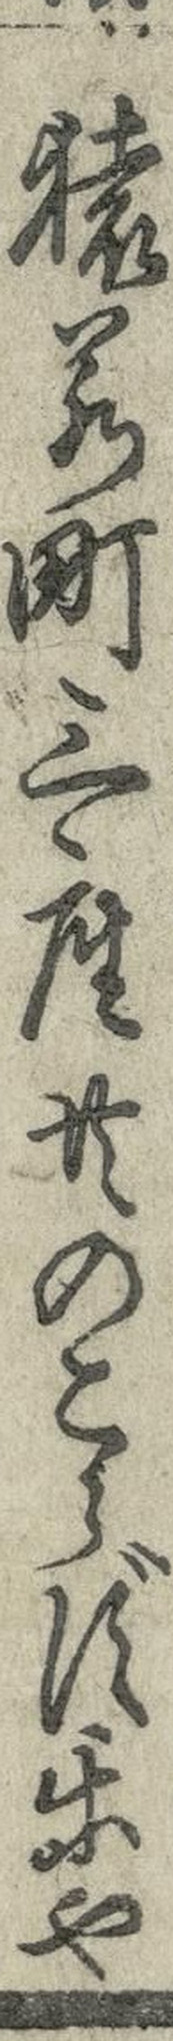猿若町三座共のこらず楽や
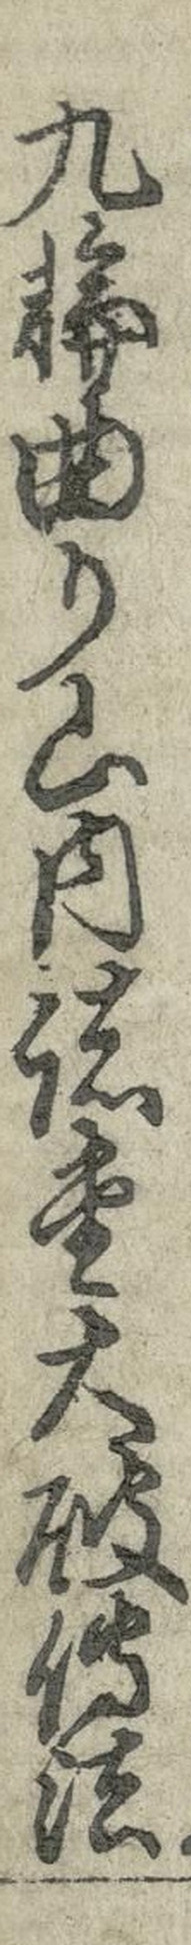九輪曲り山内諸堂大破伝法
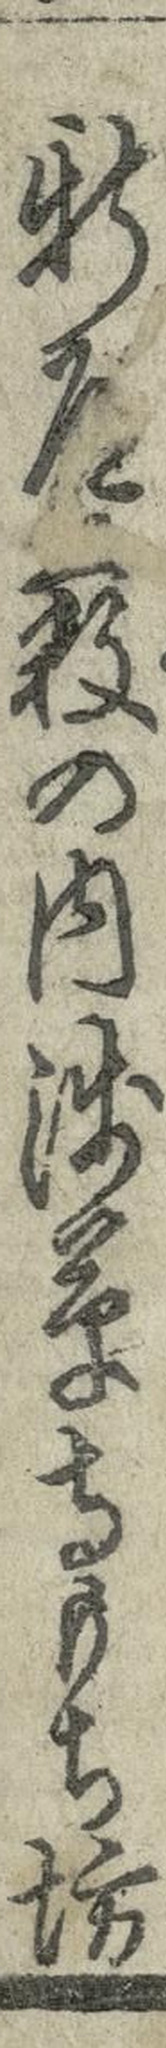新道藪の内浅草寺もち坊
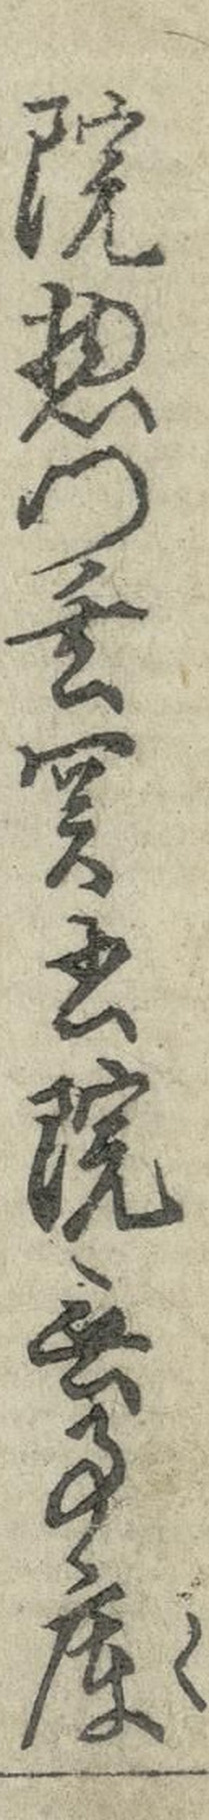院惣門玄関書院無事庫
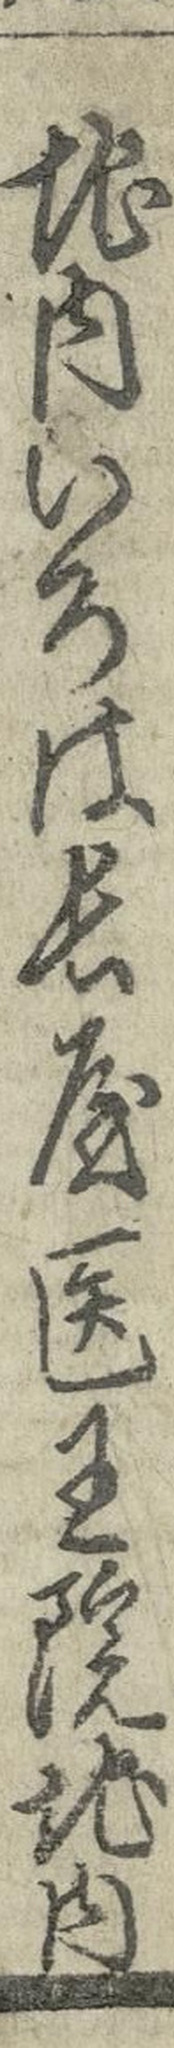地内いろは長屋医王院地内
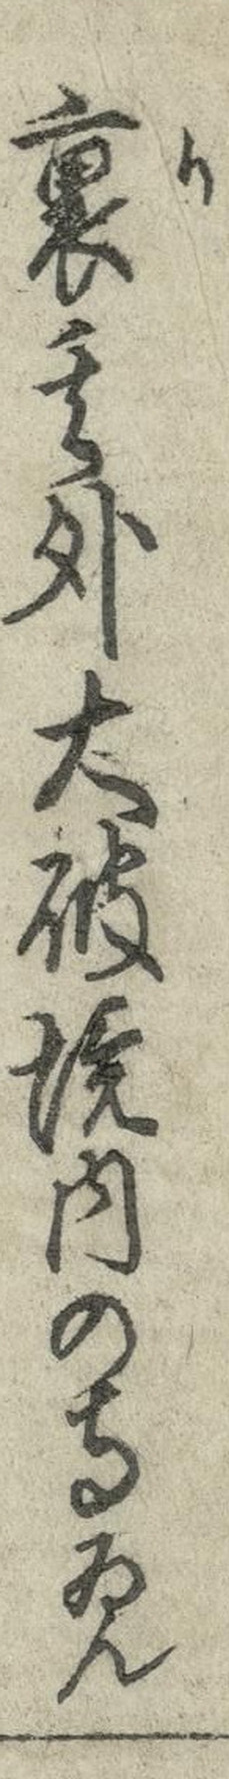裏其外大破境内の寺ゐん
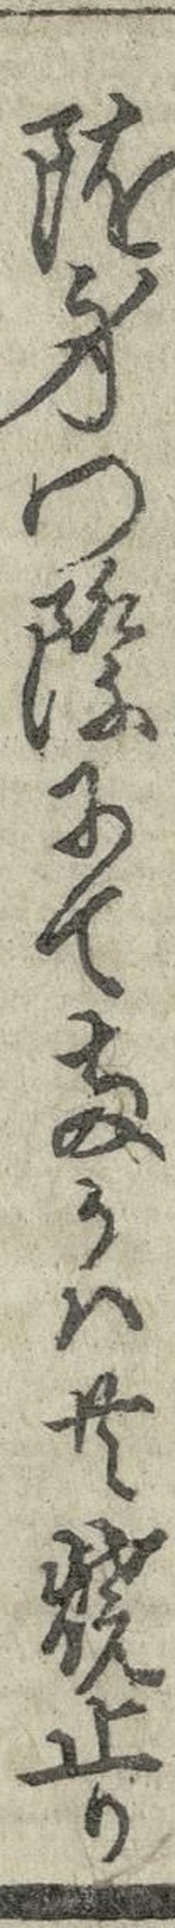随身門際にて両かは共焼止り
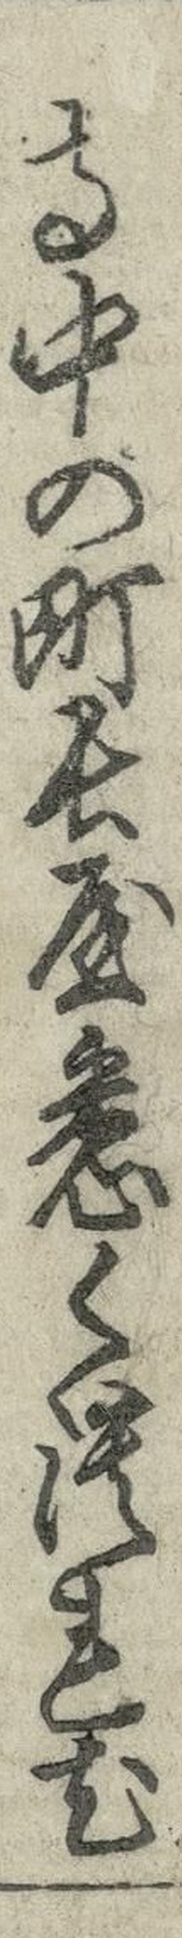寺中の町長屋悉く潰れ尤
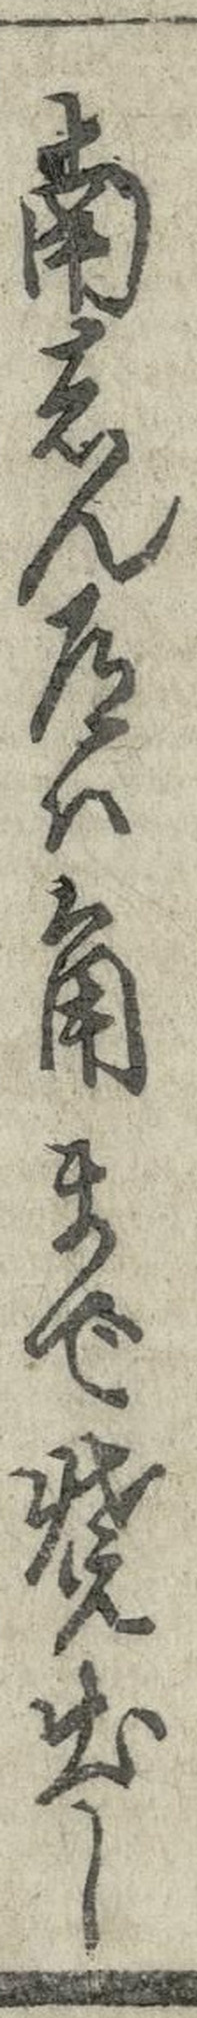南しん道は角まで焼出し
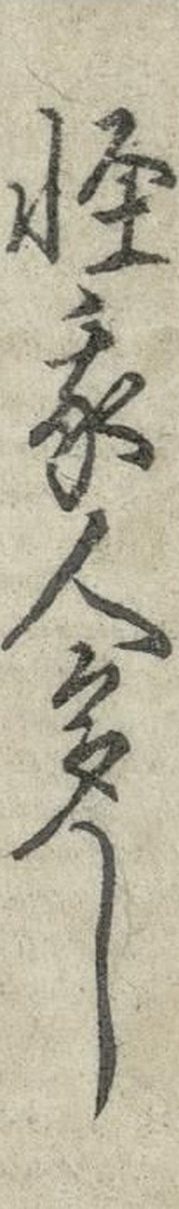怪我人多し
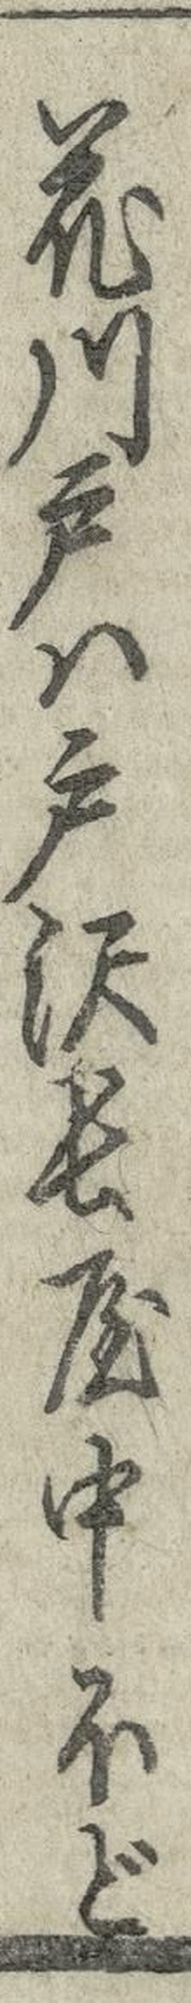花川戸は戸沢長屋中ほど
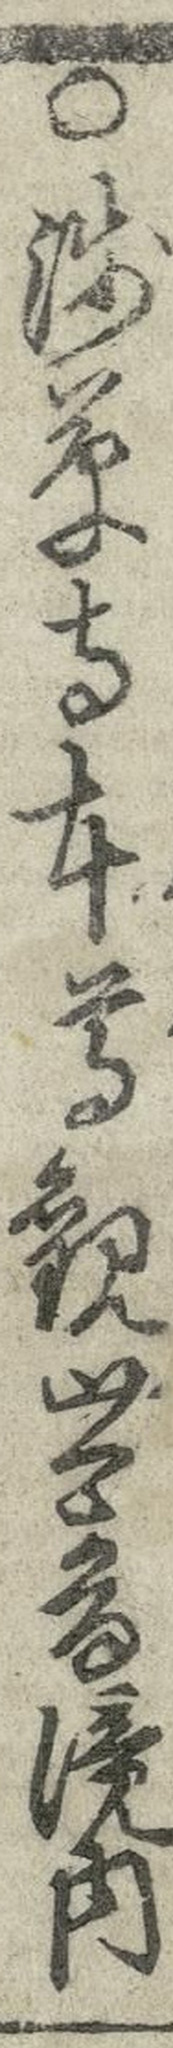○浅草寺本尊観世音境内
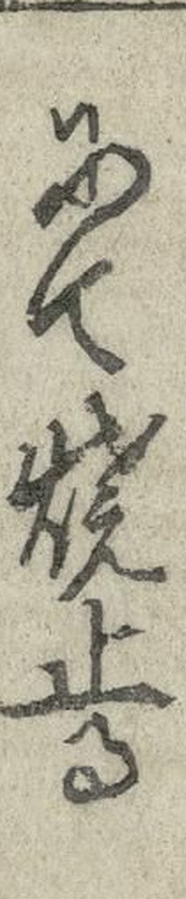にて焼止る
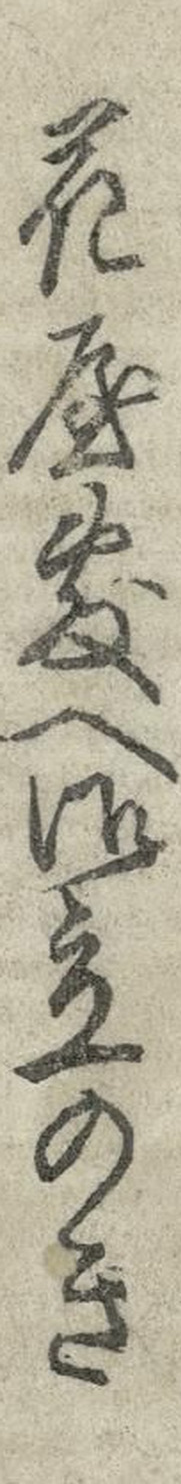花屋敷へ御立のき
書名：江戸　大地震末代噺の種　全
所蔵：東京大学地震研究所図書室 Earthquake Research Institute Library, The University of Tokyo, JAPAN
